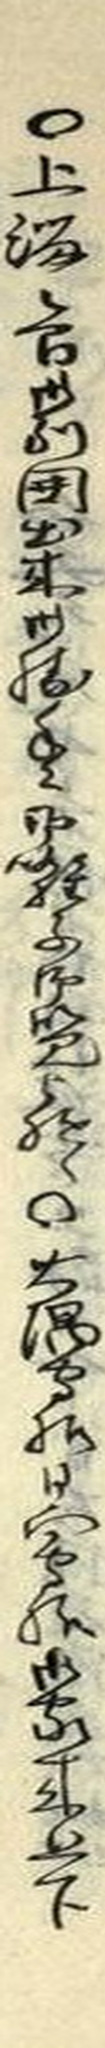〇上溜之間御別囲出来御勝手ニ御囃子御覧被遊候〇大隅守様日向守様御家来上下
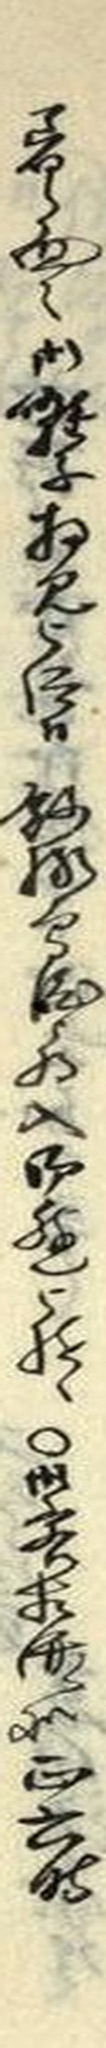着之面々御囃子拝見被仰付殿様鳥渡被為入御逢被遊候〇御客相済候処正六時
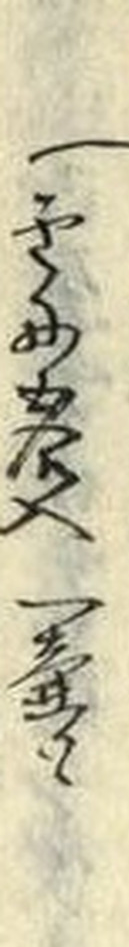雲丹五合入一壺ツヽ
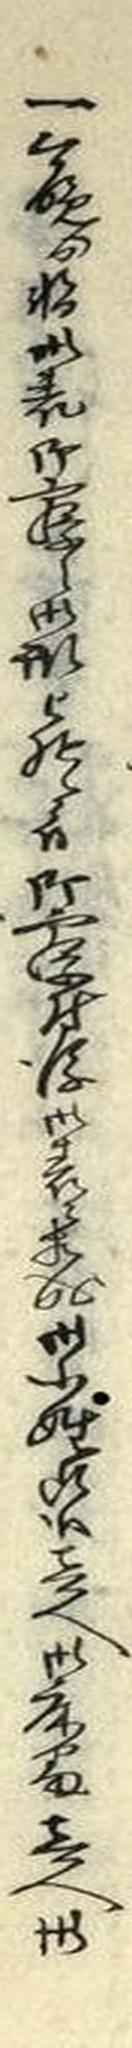一今晩ゟ暫御表御寝之御形被遊候ニ付御寝付後御表ニ相成御小姓頭取壱人御床番壱人御
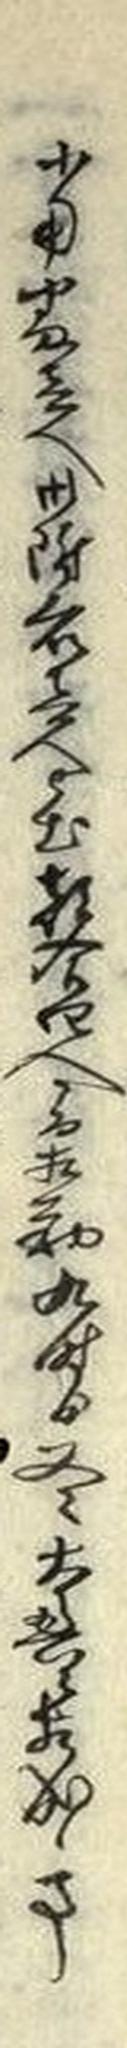小用番壱人御附衆壱人被出都合四人ニ而相勤九時ゟ又々大奥ニ相成候事
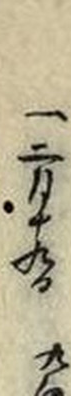一二月十九日
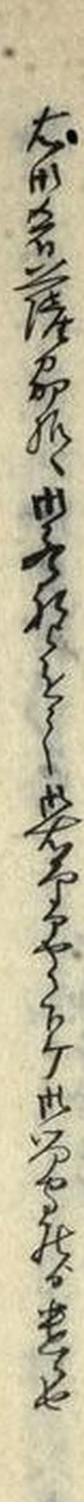右御肴薩州様へ御答礼被進之御右筆部屋へ下ケ御留守居ゟ遣候由

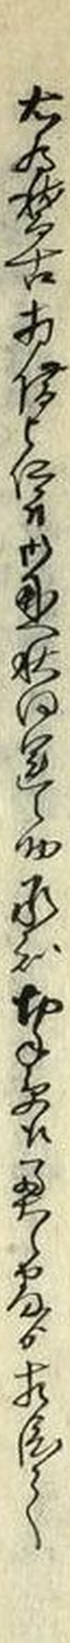右為稽古拝借被仰付御用人秋田運之助承知切手受取奥之番ゟ相渡之
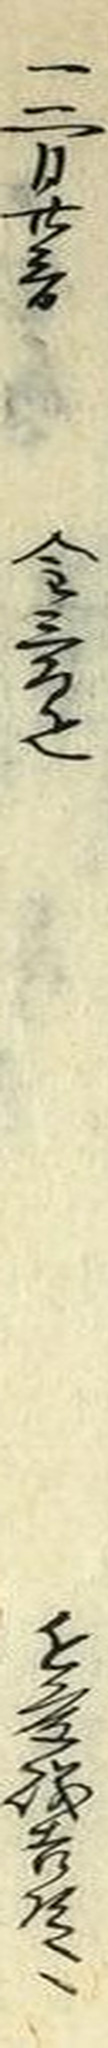一二月廿三日金三百疋近藤磯吉殿へ
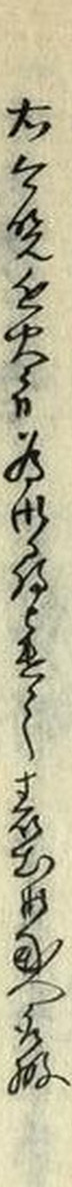右今晩近火ニ付為御尋被遣之表出御用人取扱
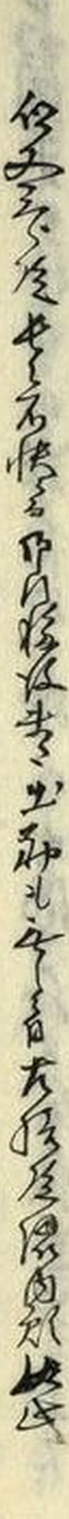但又三郎殿長々不快ニ而御引移後未た出勤も無之ニ付左膳殿依内願如此
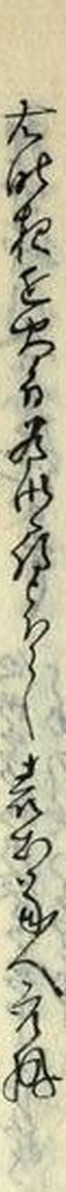右昨夜近火ニ付為御尋被下之表御用人取扱
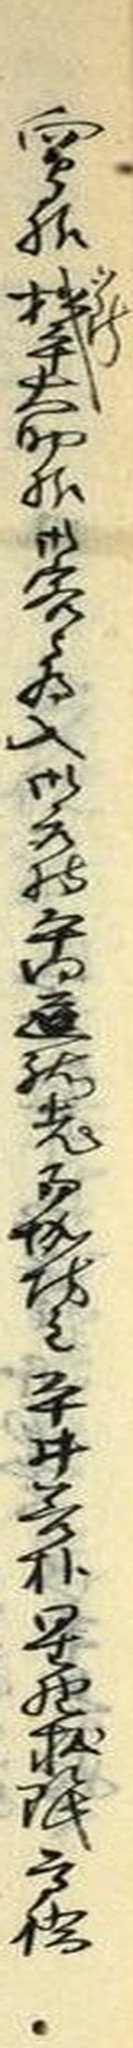向守様松平大助様御客被為入御取持平田道祐老御城坊主平井善朴星野求珉高橋
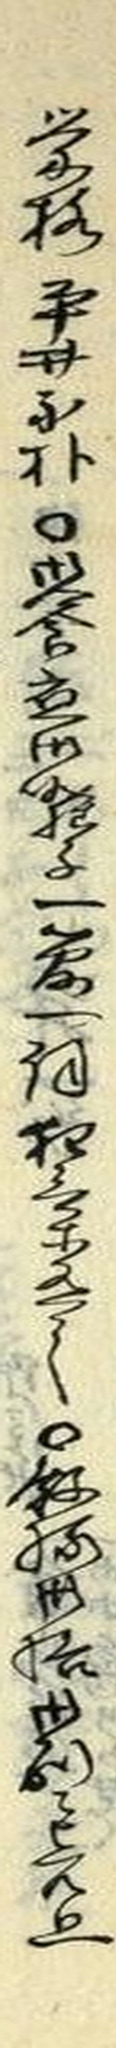栄格平井永朴〇御饗応御囃子一管一詞狂言等有之〇殿様御膳御別ニ被召上
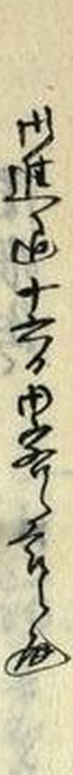御進退十六日御客之節之通
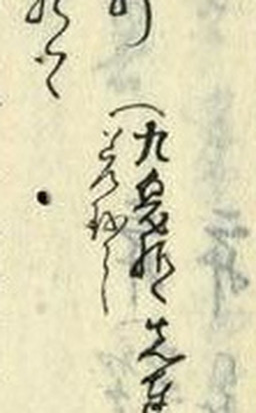差越之
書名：少傅日録抄（斉善付側向頭取日記、在府）
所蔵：福井県文書館 Fukui Prefectural Archives
